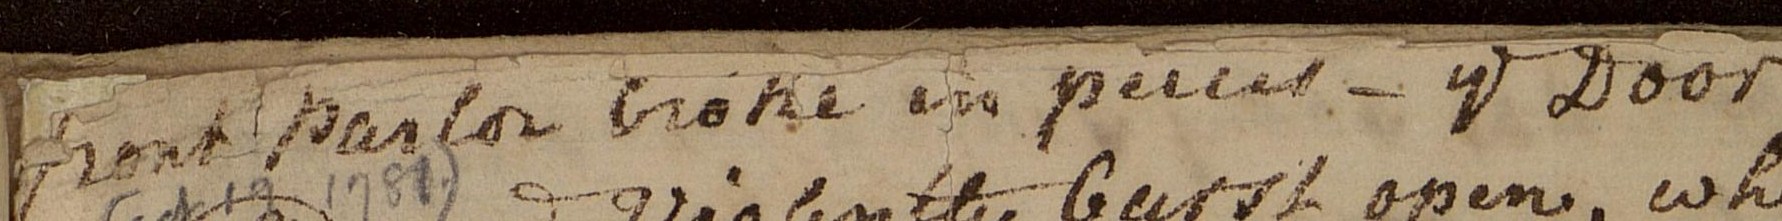front parlor broke in peices- y^e Door
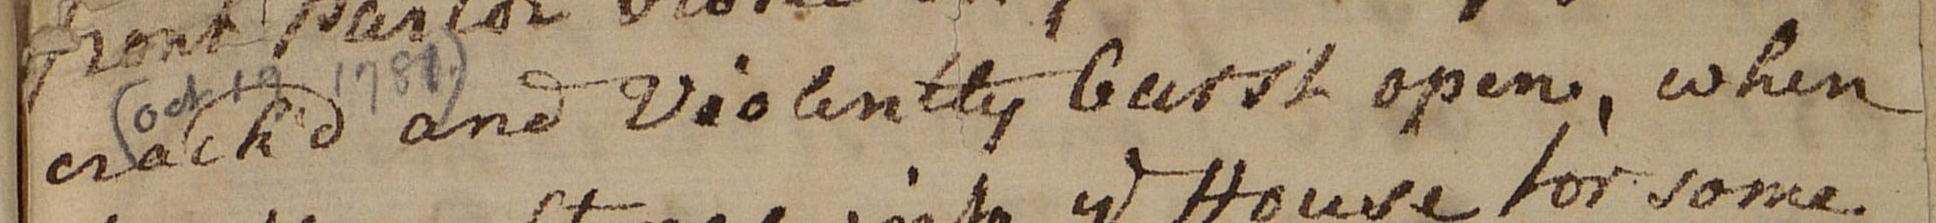cratck'd and Violently burst open, when
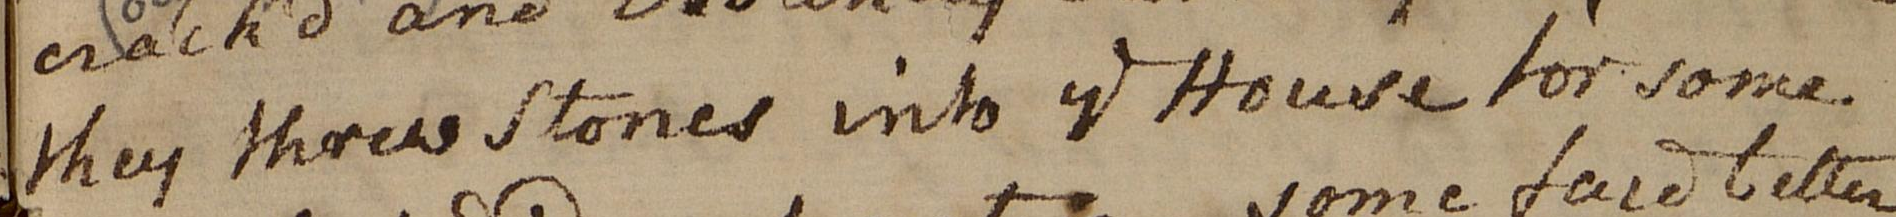they threw Stones into y^e House for some
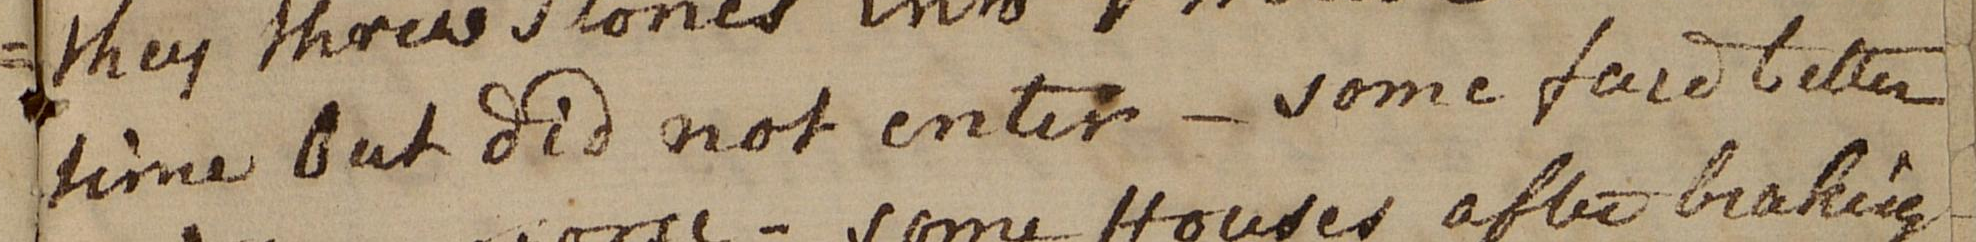time but did not enter- some fard better
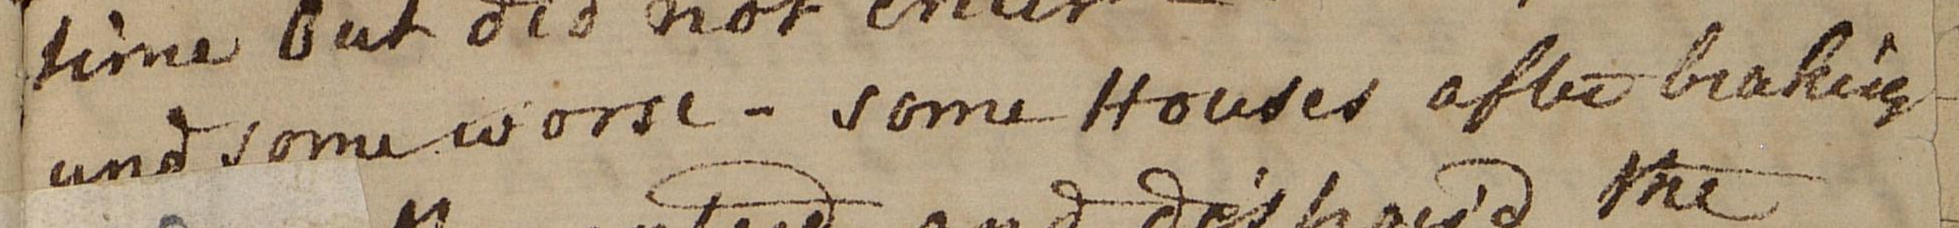and some worse- some Houses after braking
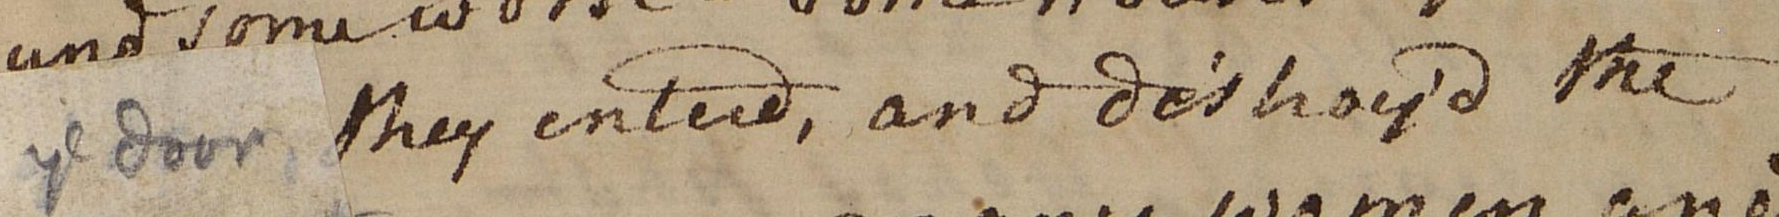y^e door they enterd, and distroy'd the
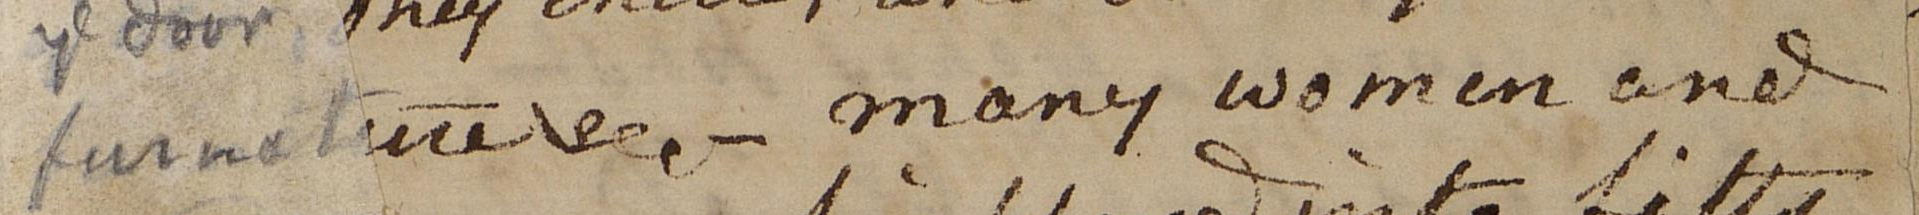furnature &c- many women and
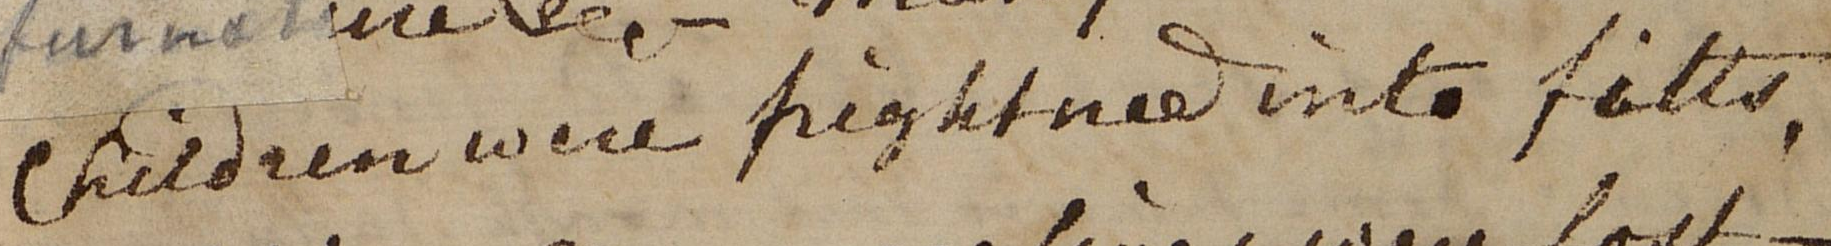Children were frightned into fitts,
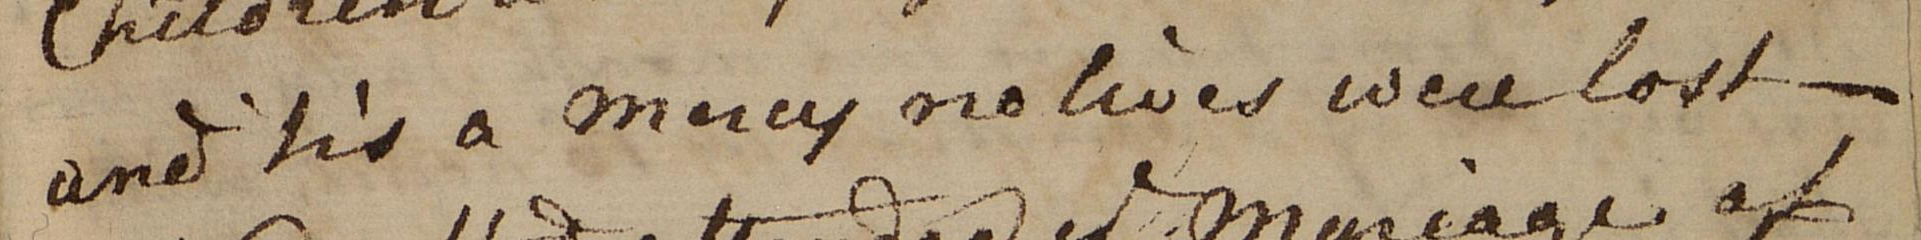and tis a mercy no lives were lost-
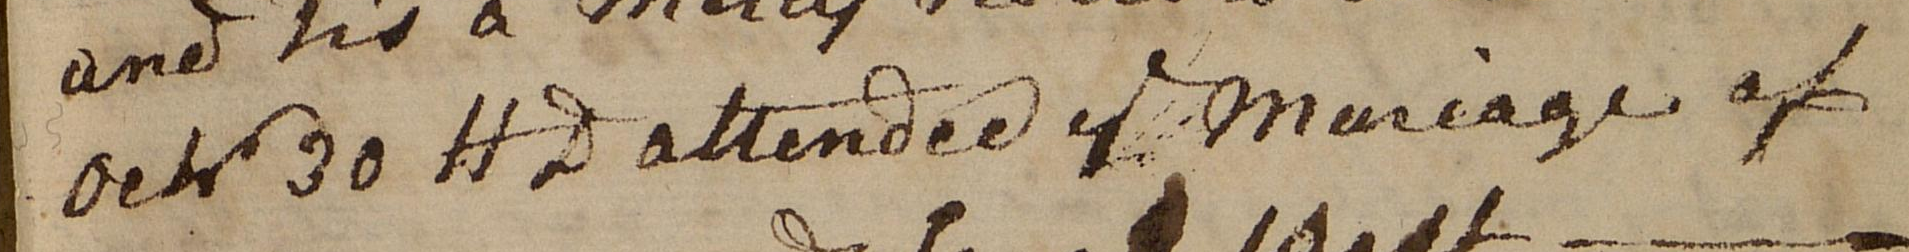Oct^r 30 HD attended y^e Muriage a
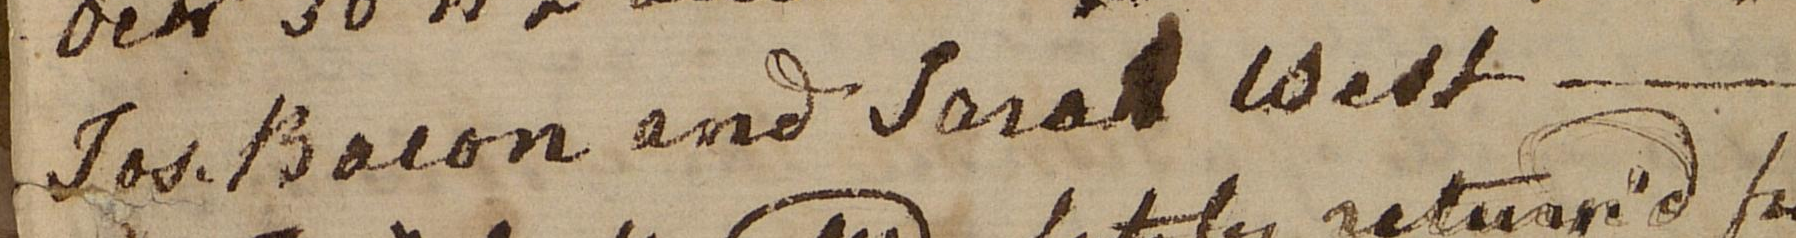Jos. Bacon and Sarah West-
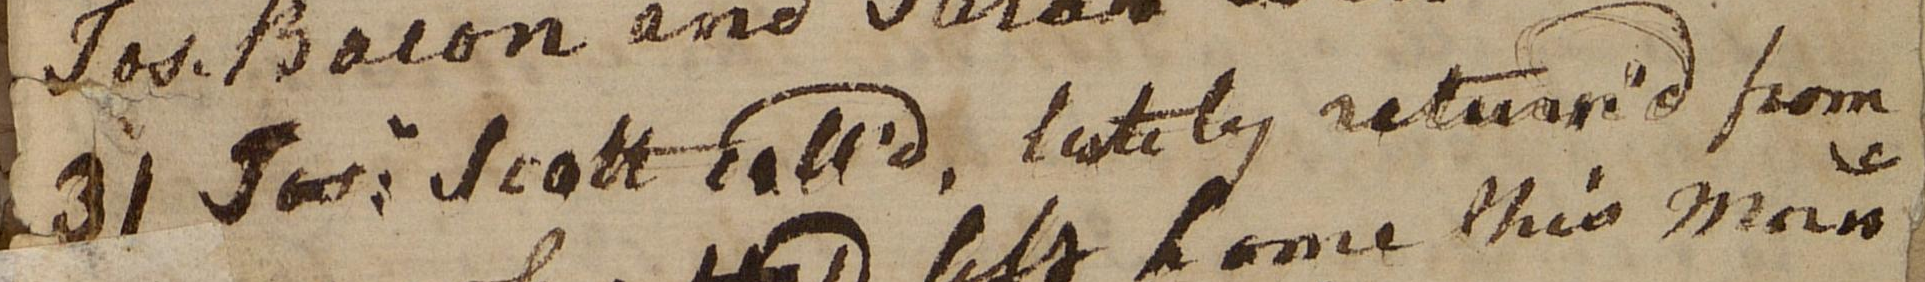31 Jos: Scott call'd, lately return'd from
